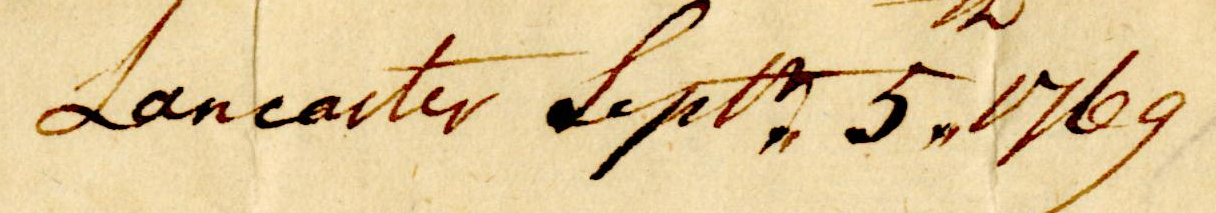Lancaster Sept^r. 5^th. 1769
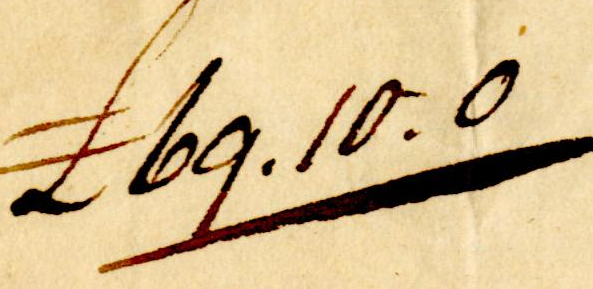£69.10.0
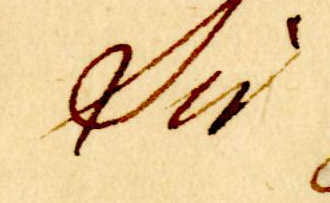Sir
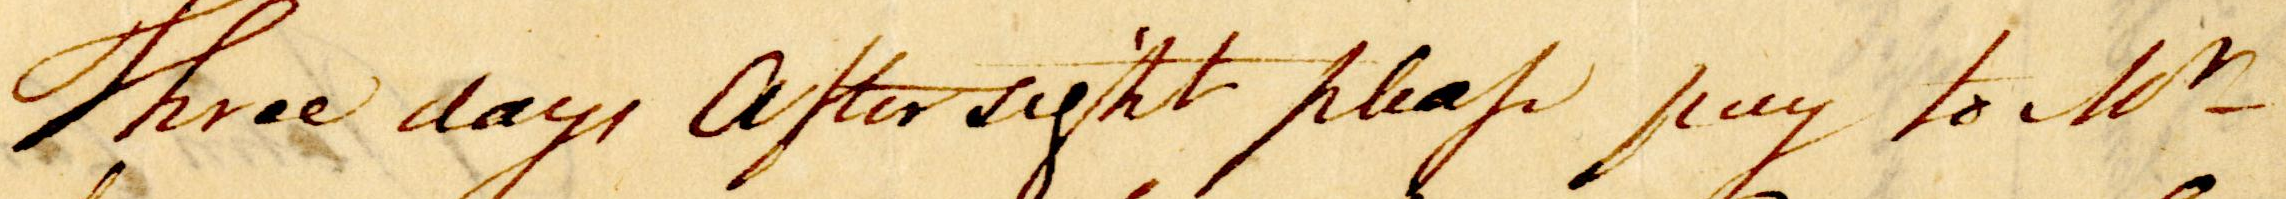Three days after sight please pay to M^r
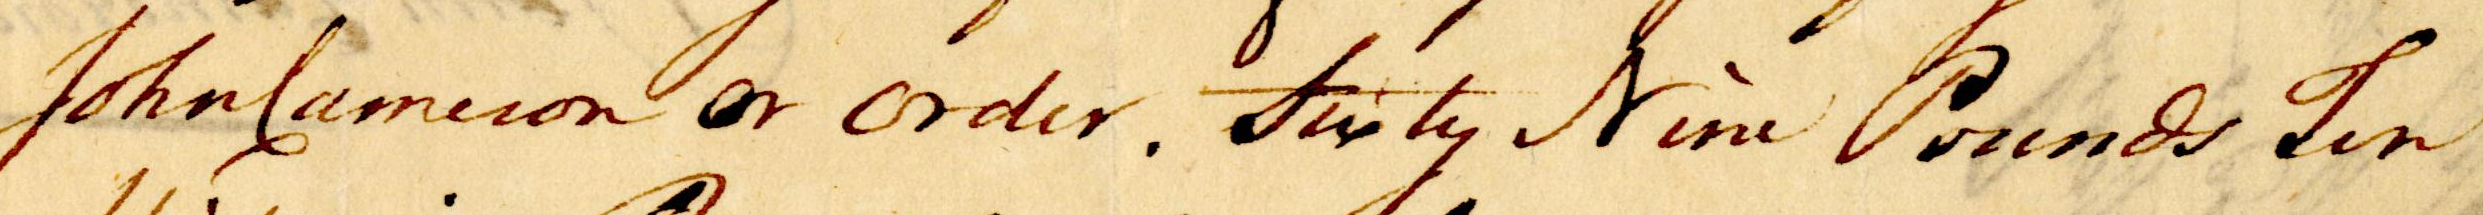John Cameron on Order. Sixty Nine Pounds Ten
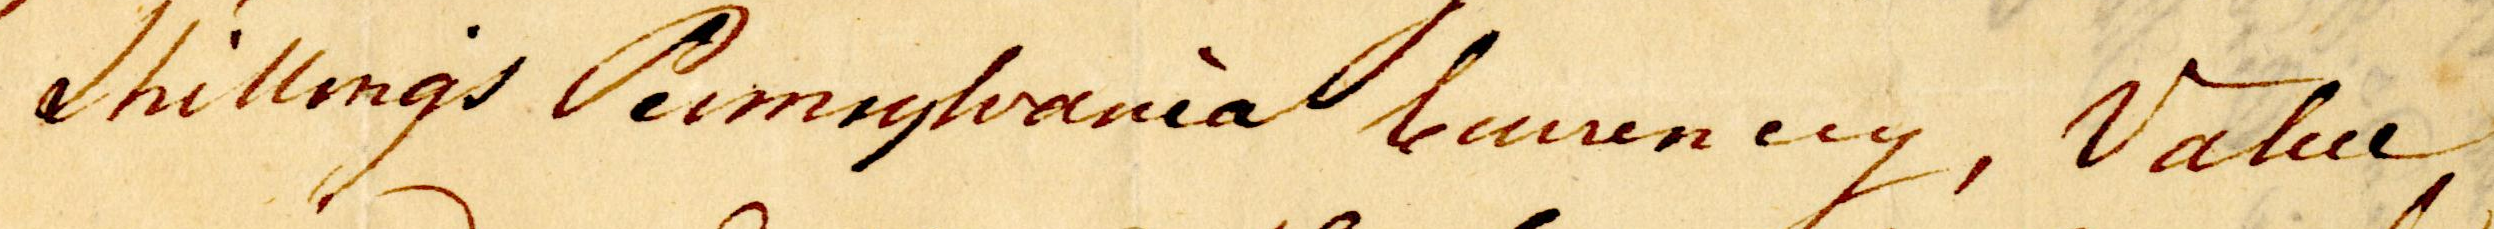Shillings Pennsylvania Currency, Value
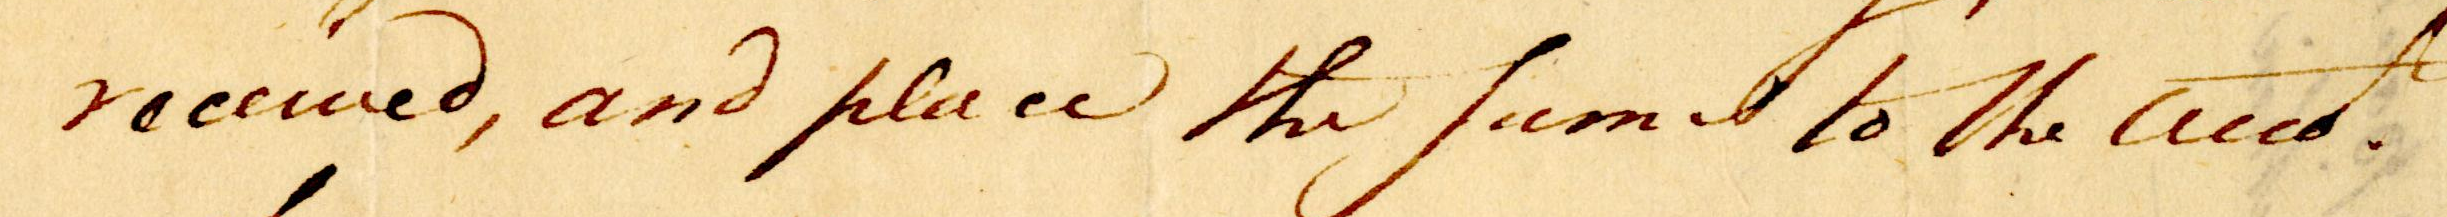received, and please the Send to the acco^t.
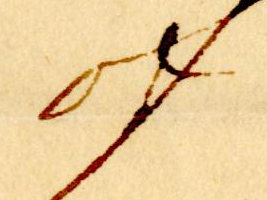of
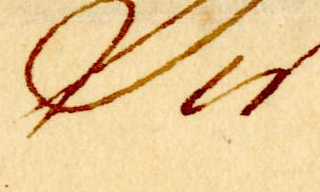Sir
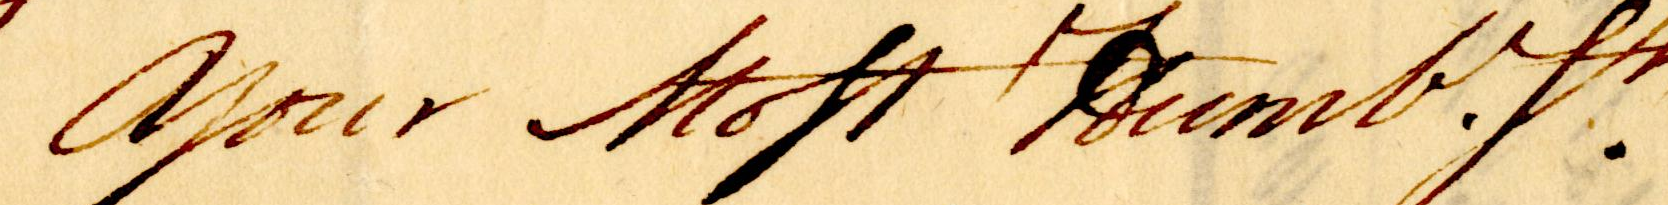Your most Humb. S^t.
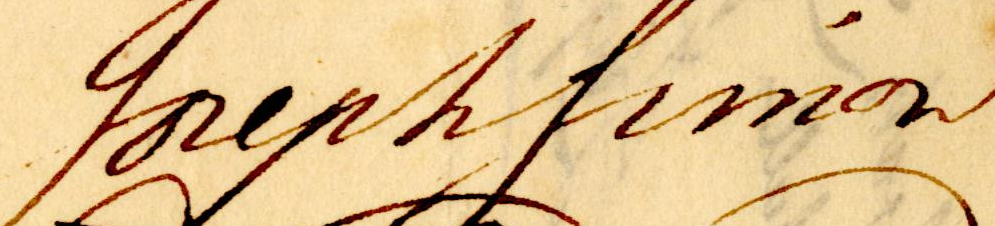Joseph Simon
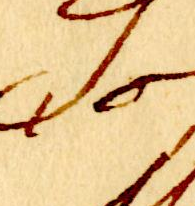To
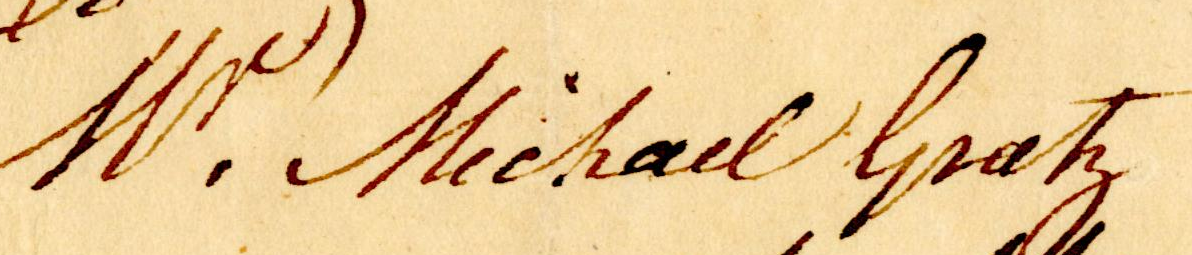M^r. Michael Gratz
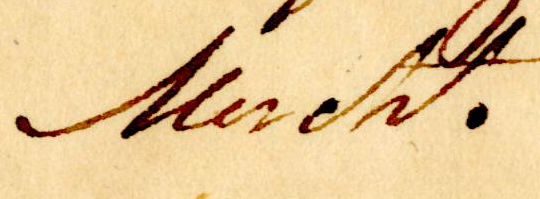Merch^t.
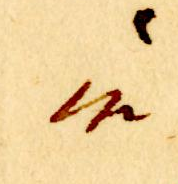In
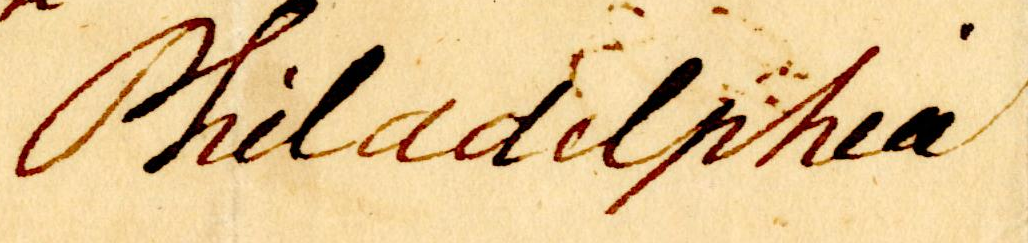Philadelphia
